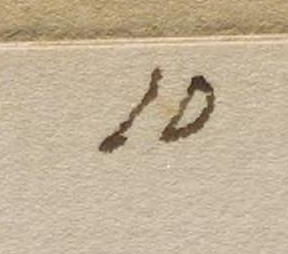10
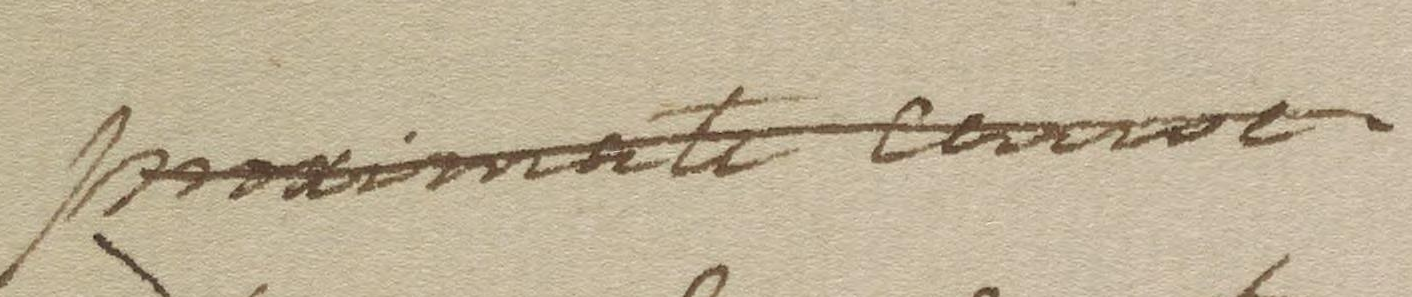proximate cause
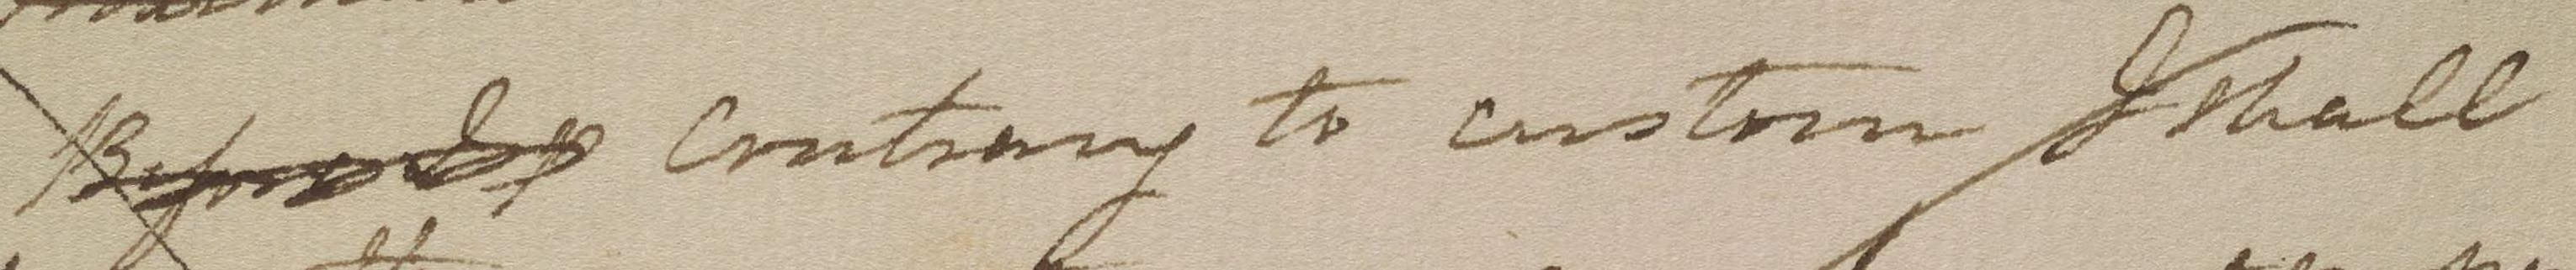[Before I p] Contrary to custom I shall
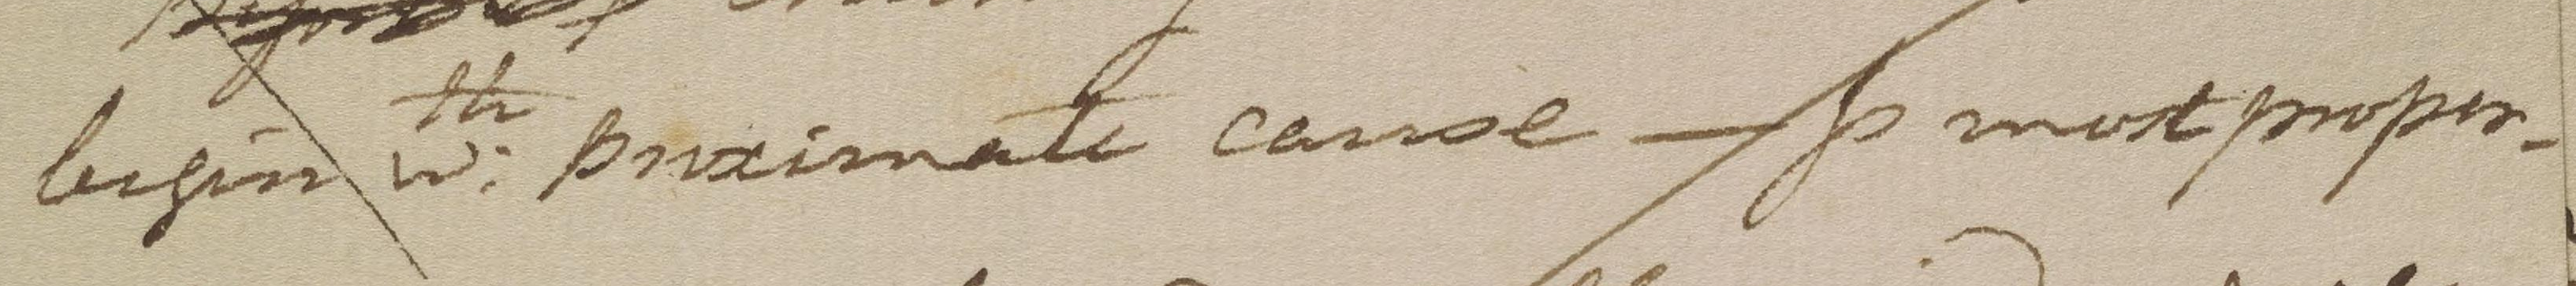begin w^th proximate cause- as most proper
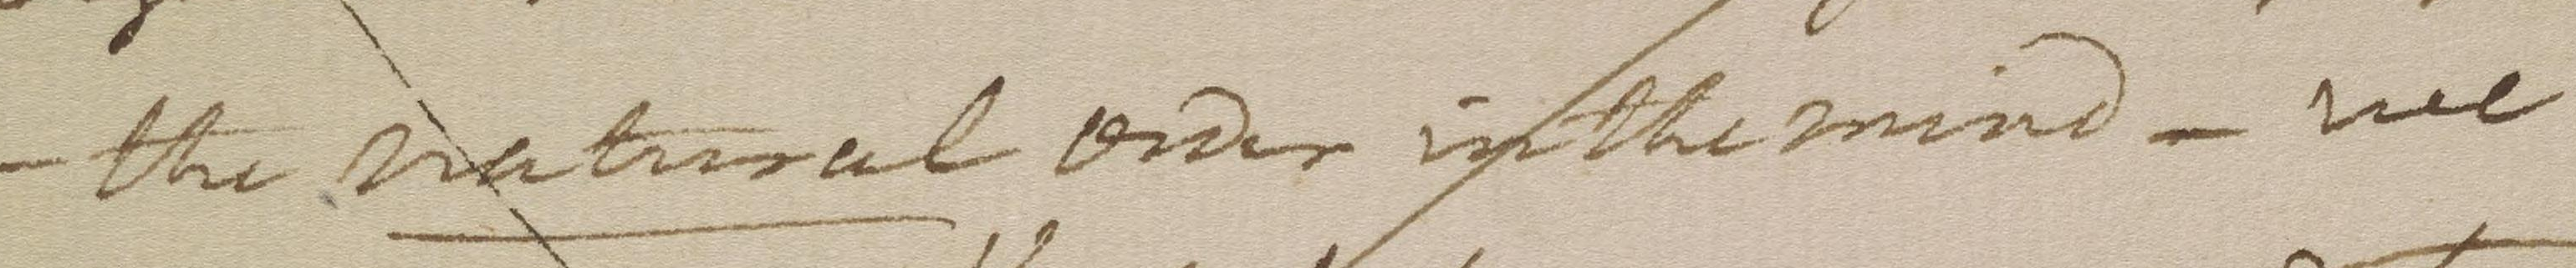-the natural order in the mind- we
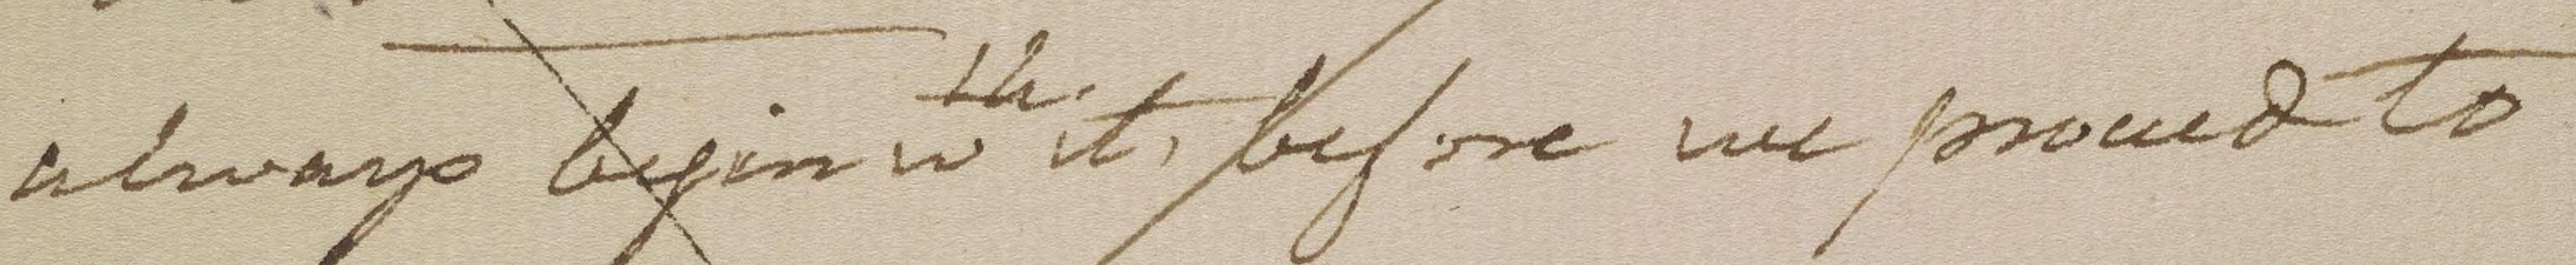always begin w^th it, by one we proceed to
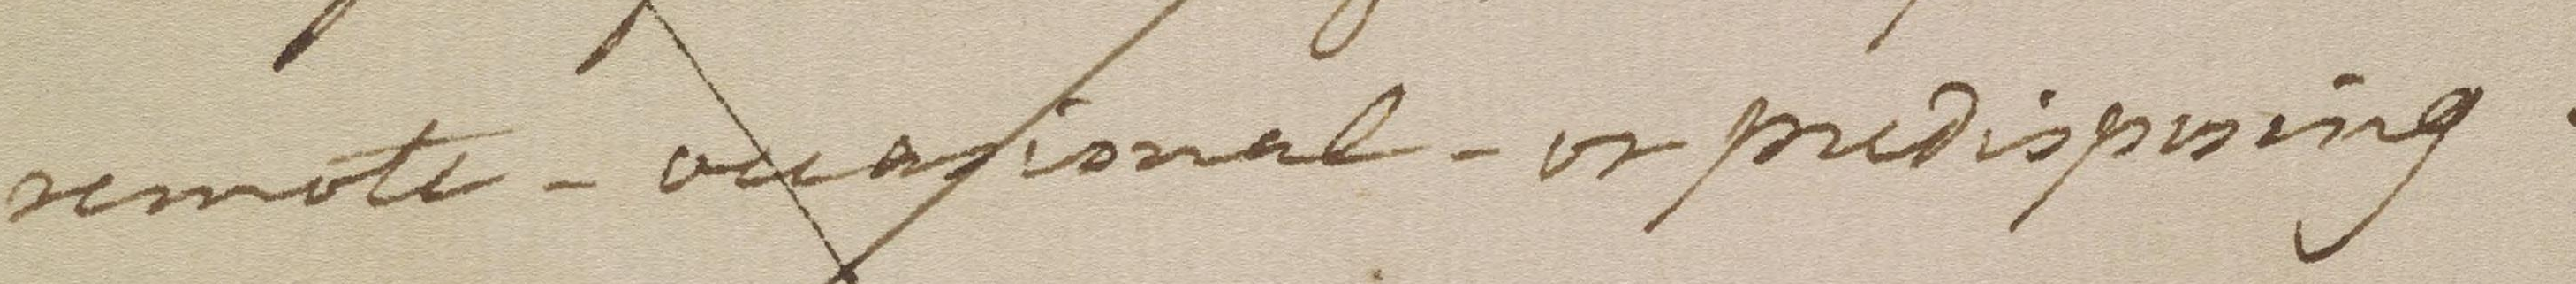remote, occasional, or predisposing.
